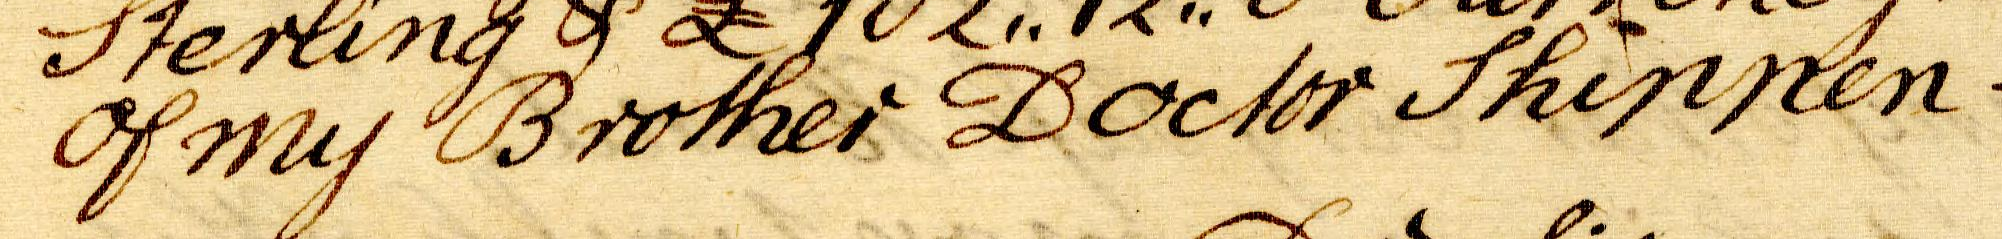of my Brother Doctor Shippen
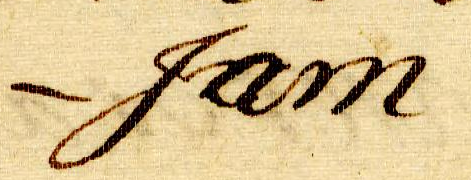-I am
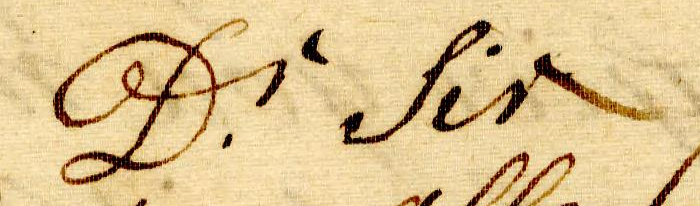D^r. Sir
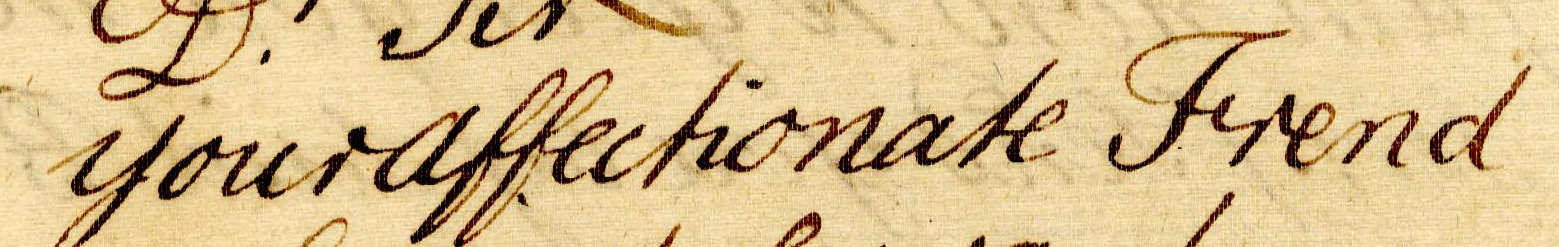Your affectionate Frend
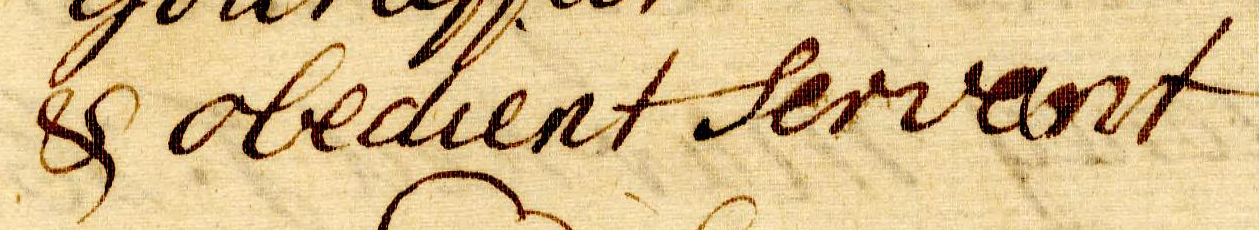& obedient Servant
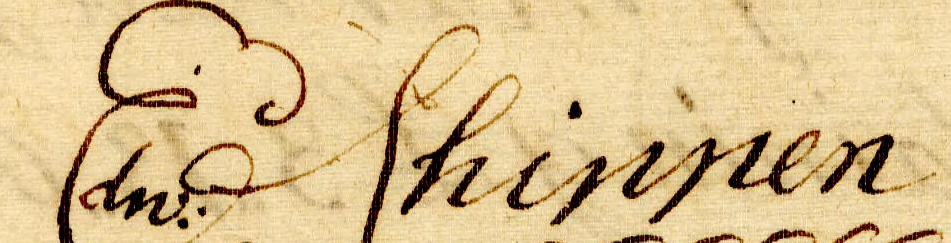Edw:^d Shippen
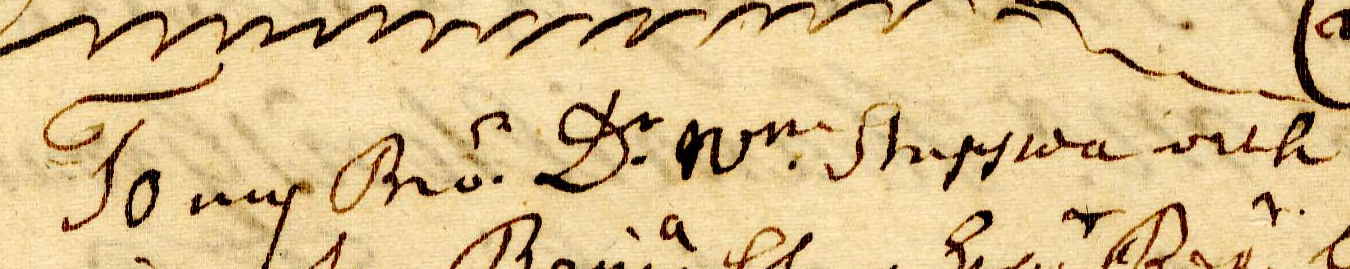To my Bro^r. D^r. W^m. Shippen with
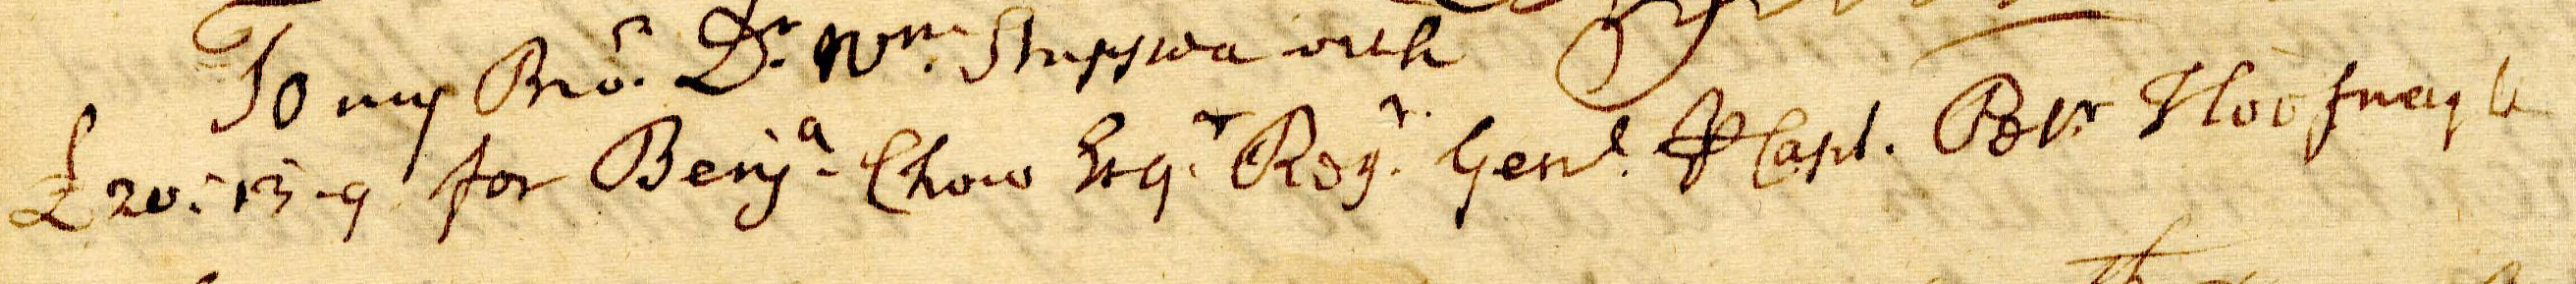£20..13.9 for Benj^a. Chew Esq^r. Reg^r. Genl. per Capt. Pet^r. Hoofnagle
